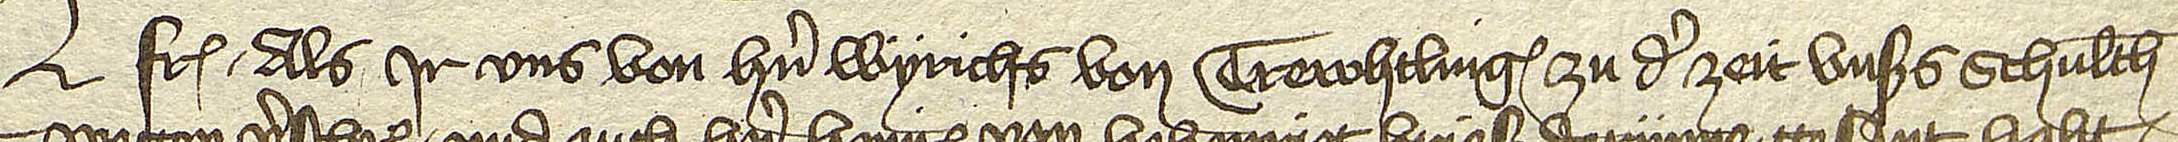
L* fr* / Als Ir vns von hn* wyrichs von Trewhtling* cʒu d* cʒeit vnſ*s Schulth*
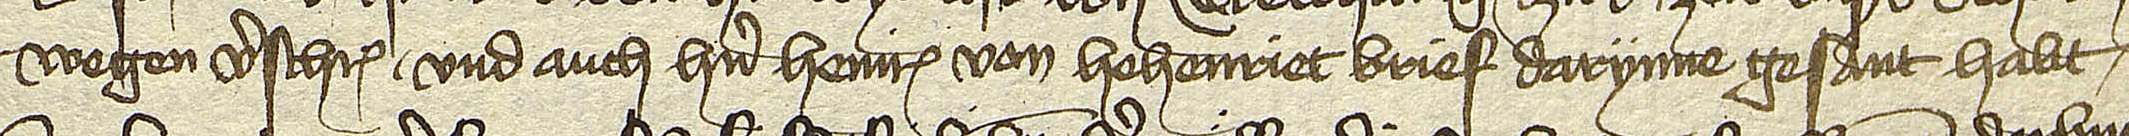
wegen v*ſchr* / vnd auch hn* heinr* von hehenriet brief darynne geſant habt /
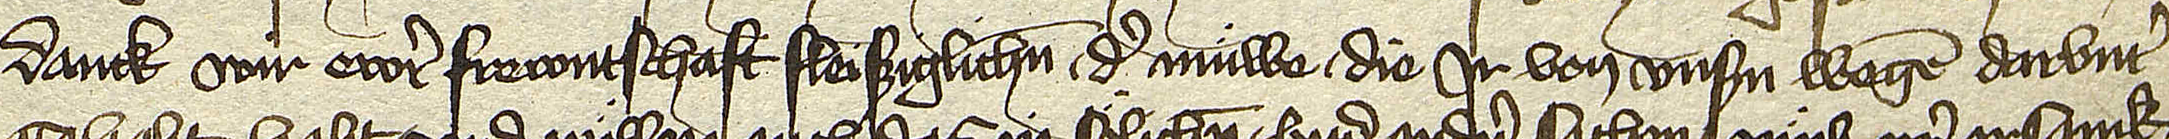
danck wir ewr* frewntſchaft fleiſʒiglichn* / d* müwe / die Ir von vnſ*n wege* darvnt*
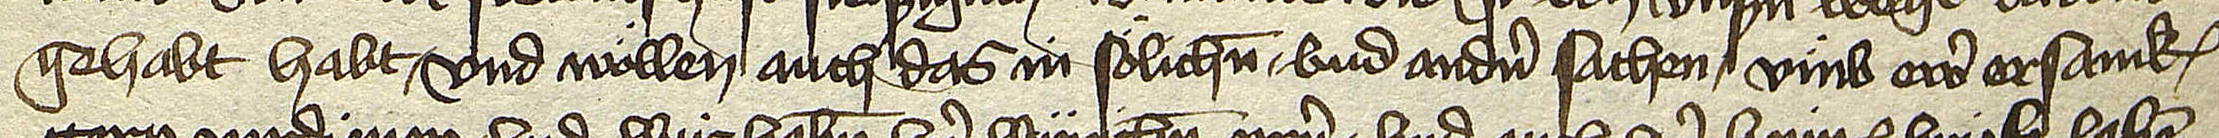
gehabt habt / vnd wöllen auch das in ſölichn* / vnd andn* ſachen v̈mb ew* erſamk*
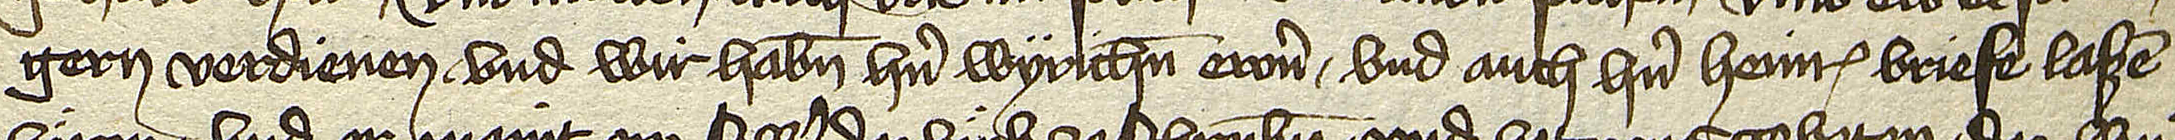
gern verdienen / vnd wir habn* hn* wyrichn* ewn* / vnd auch hn* heinr* briefe laſʒe*
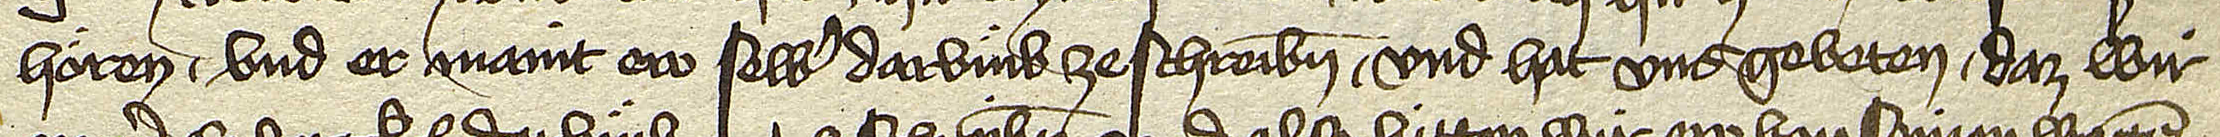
hören / vnd er maint ew ſelb* darv̈mb cʒeſchreibn* / vnd hat vns gebeten / daʒ wir
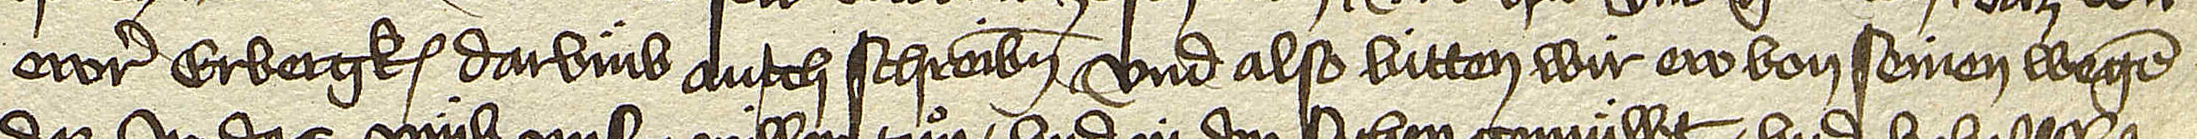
ewr* Erbergk* / darv̈mb auch ſchreibn* / vnd alſo bitten wir ew von ſeinen wege*
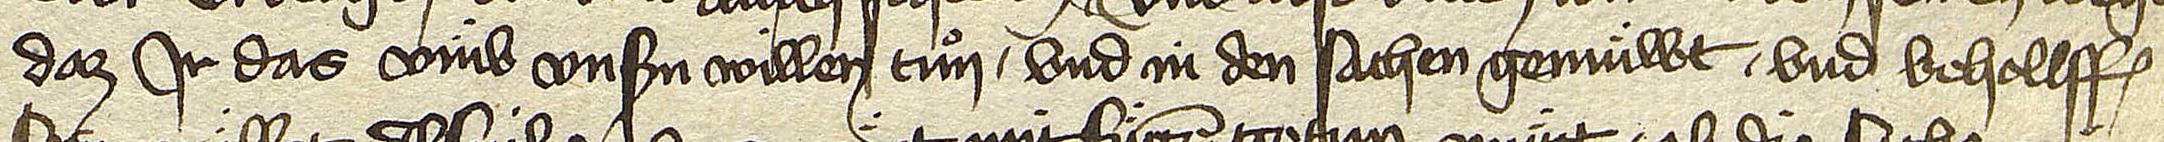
daʒ Ir das v̈mb vnſ*n willen tün / vnd in den ſachen gemüwt / vnd behollff*
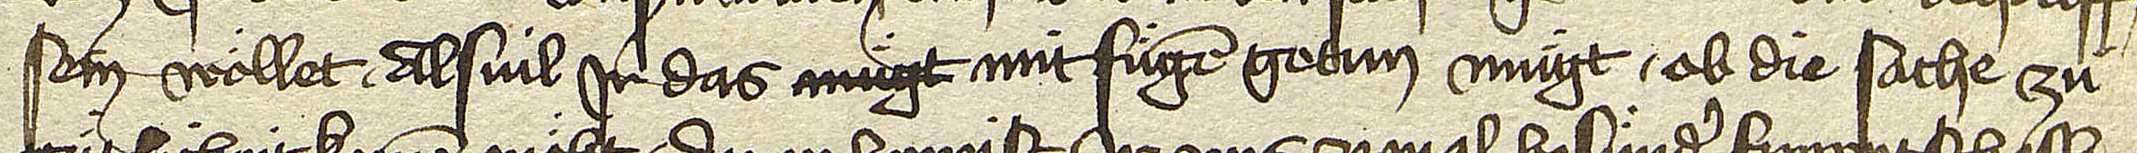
ſein wöllet / Alſuil Ir das mügt mit füge* getun mügt / ob die ſache cʒu
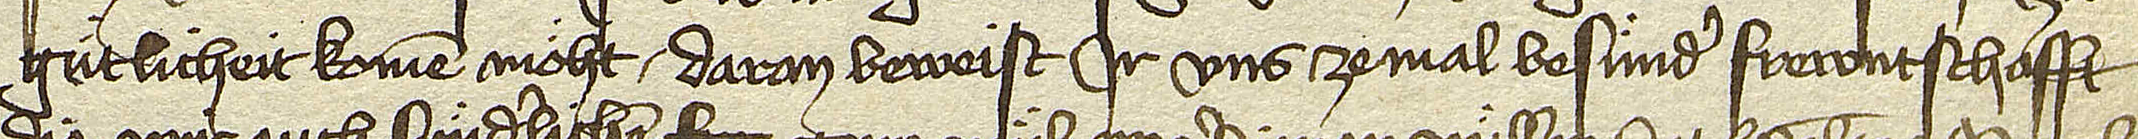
gütlichkeit kome* möht / daran beweiſt Ir vns cʒemal beſünd* frewntſchafft
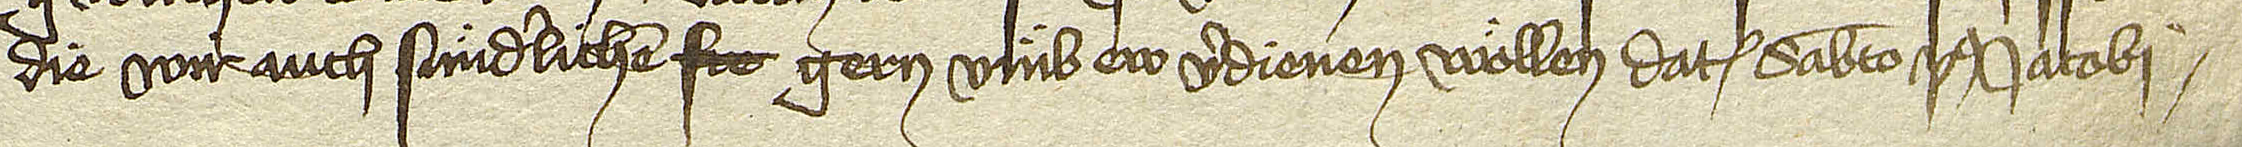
die wir auch ſünd*liche* fre gern v̈mb ew v*dienen wöllen dat* Sabto* p* Iacobi* /
